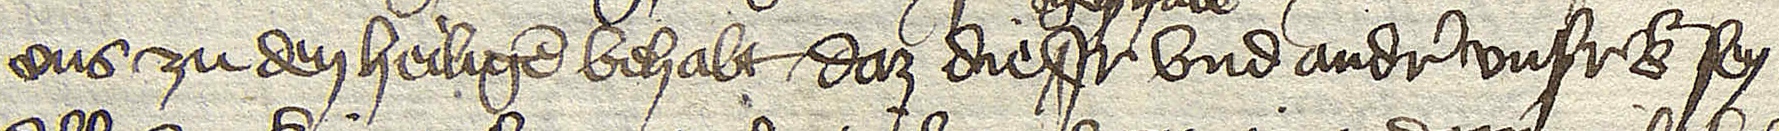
vns cʒu den heilige* behabt / daʒ die Ir vnd andr* vnſ*r B* ſey
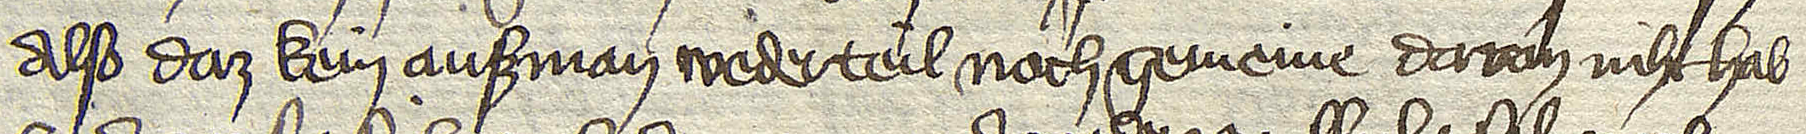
Alſo daʒ kein auſʒman wederteil noch gemeine daran niht hab
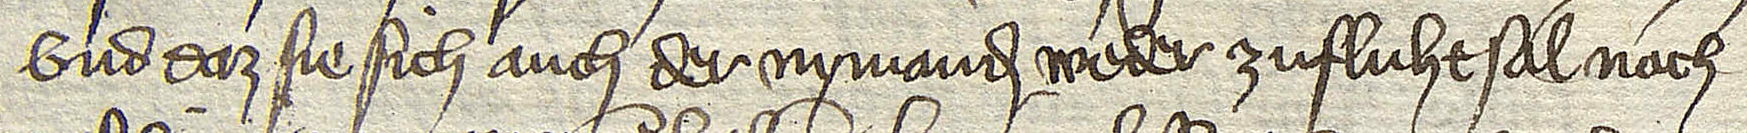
vnd daʒ ſie ſich auch der nymand* weder cʒufluht ſol noch
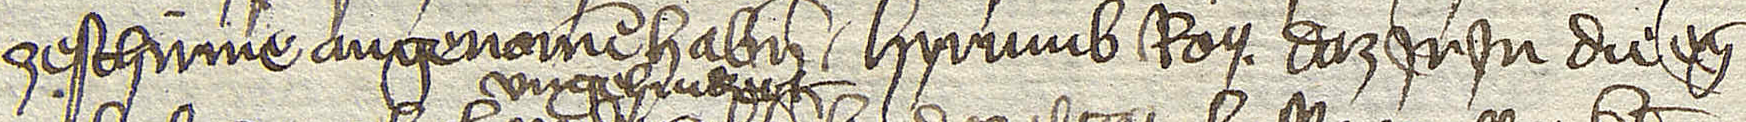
cʒeſchirme angenome* habn* / hyrümb Ro* . daʒ Ir In die eg*
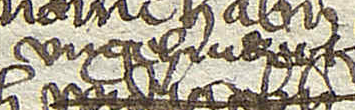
vngehindert
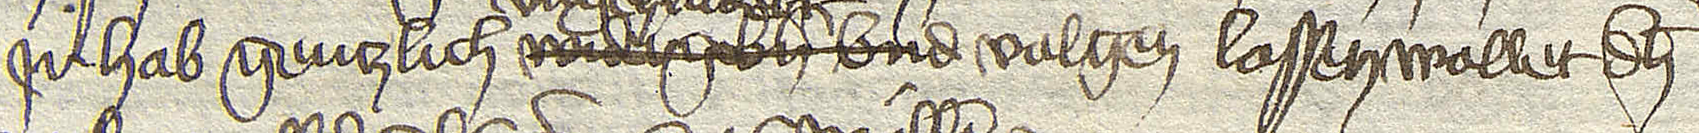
Ir hab gencʒlich widergebn* vnd volgen laſſen wollet d*h
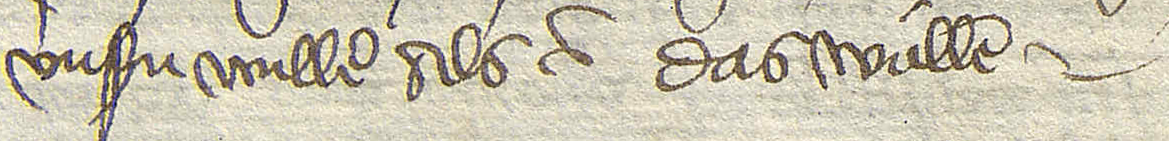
vnſ*n wille* Als ec* das wölle* ec*
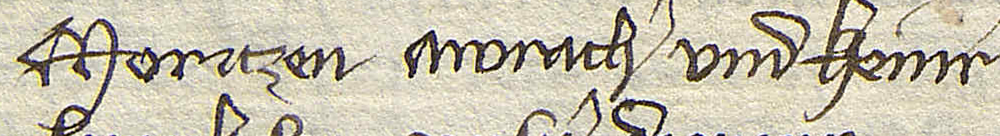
Moricʒen Awrach* vnd Heinr*
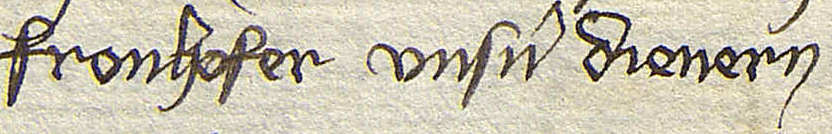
fronhofer vnſn* dienern
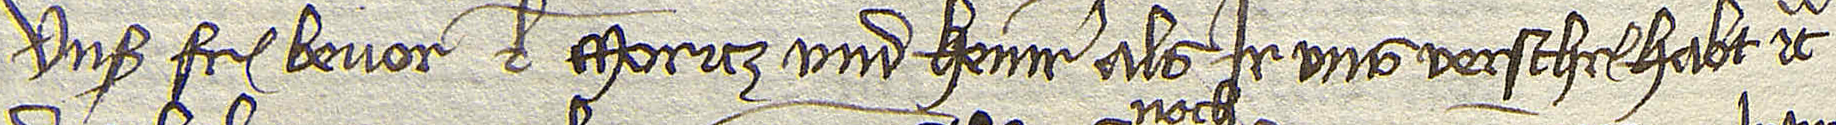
Vnſ* fr* beuor l* Moricʒ vnd Heinr* als Ir vns verſchr* habt ec*
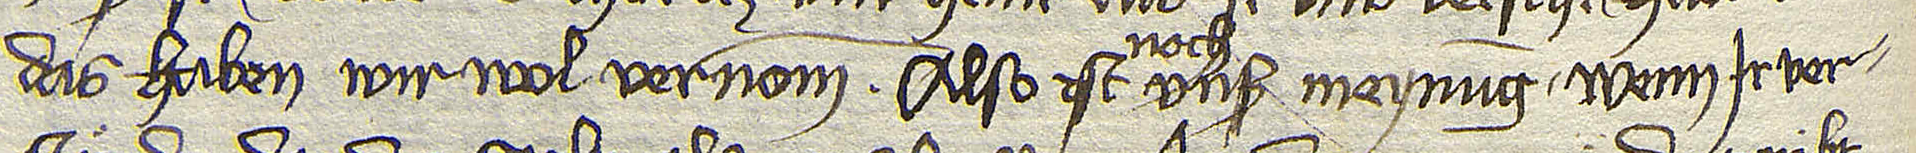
das haben wir wol vernom* . Alſo iſt vnſ* meynug* / wenn Ir ver =
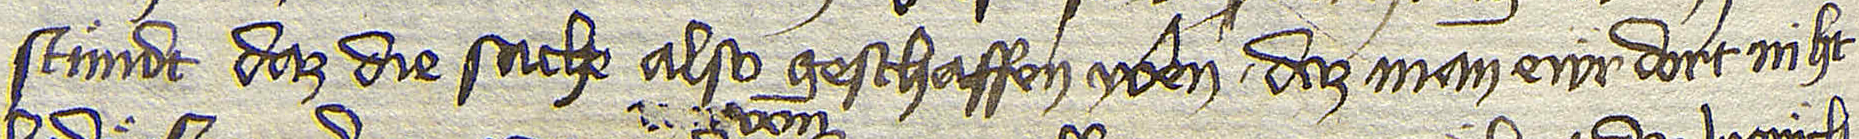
ſtündt daʒ die ſache alſo geſchaffen w*en / daʒ man eẅr dort niht
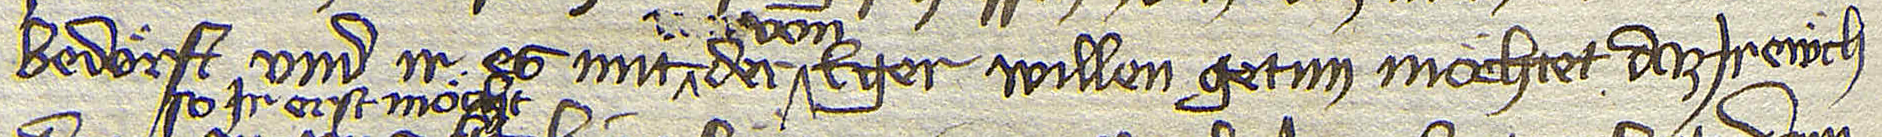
bedörft vnd ir es mit der Eger willen getun möchtet daʒ Ir eẅch
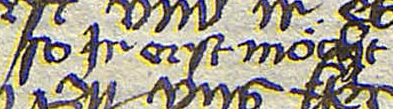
ſo Ir erſt möcht
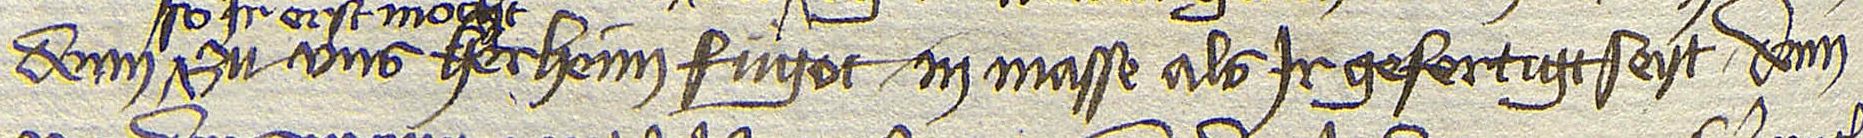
Denn ʒu vns herheim füget / in maſſe als Ir gefertigt ſeyt / Denn
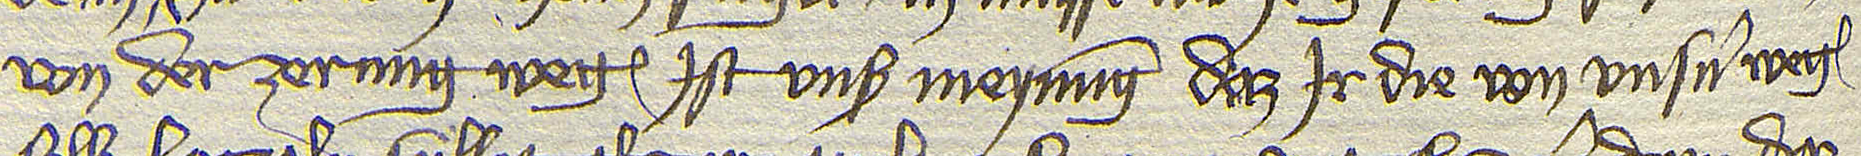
von der ʒerung weg* Iſt vnſ* meynug* daʒ Ir die von vnſn* weg*
